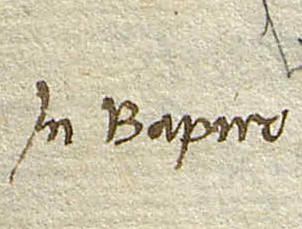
In Bapiro
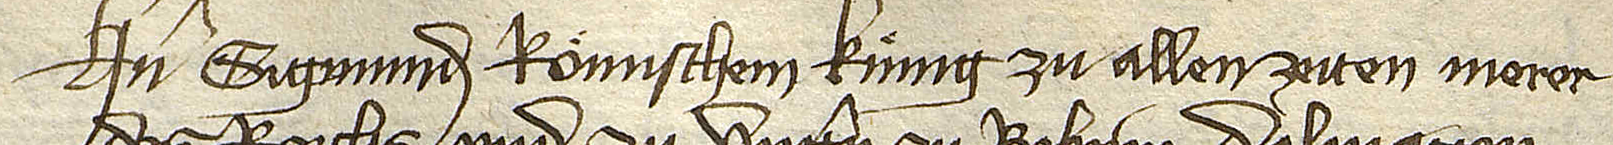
Hn* Sigmund* Römiſchem künig ʒu allen ʒeiten merer
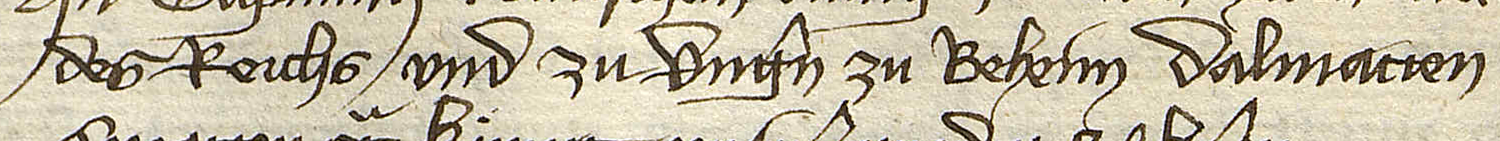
des Reichs vnd ʒu Vng*n ʒu Beheim Dalmacien
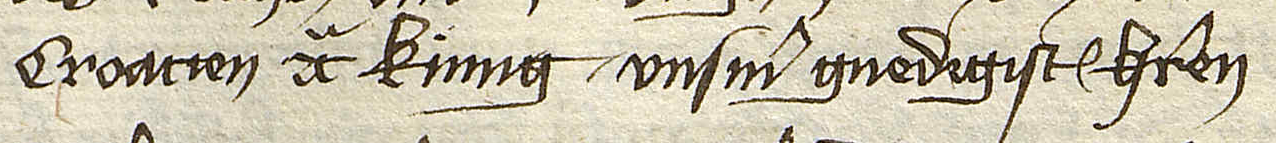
Croacien ec* künig / vnſm* gnedigiſt* hr*en
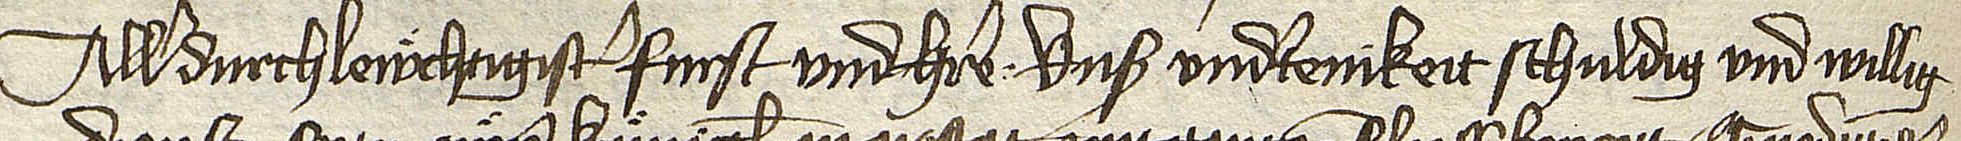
All*durchleẅchtigiſt* furſt vnd hr*e . Vnſ* vnd*tenikeit ſchuldig vnd willig
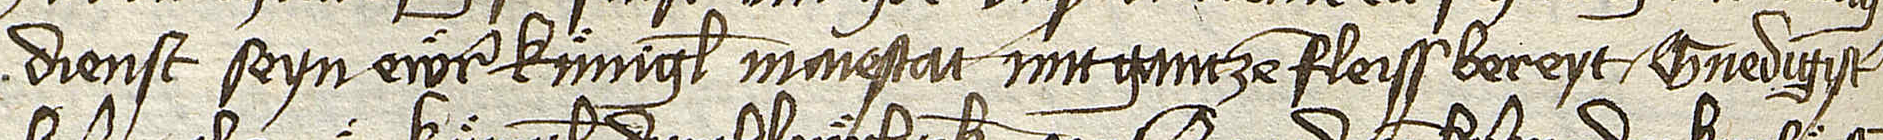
dienſt ſeyn eẅr* künigl* in maieſtat mit gancʒe* fleiſſ bereyt / Gnedigiſt*
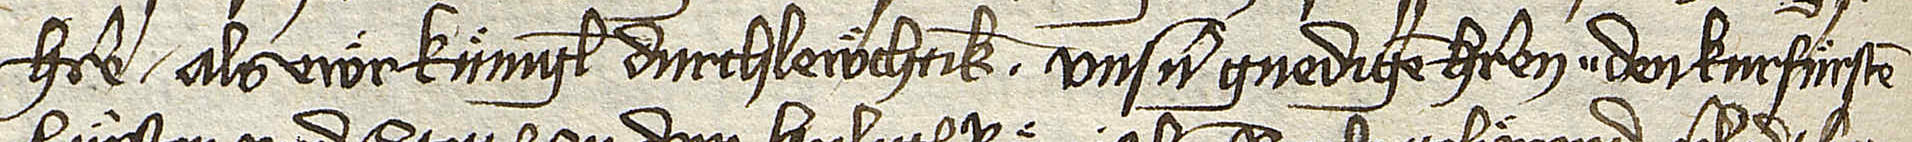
hr*e / als eẅr künigl* durchleẅchtik* . vnſn* gnedige* hr*en ~ den kurfürſte*
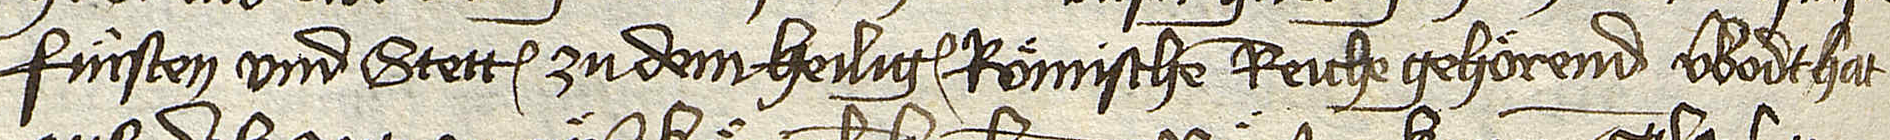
fürſten vnd Stett* ʒu dem heilig* Römiſche* Reiche gehörend v*bodt hat
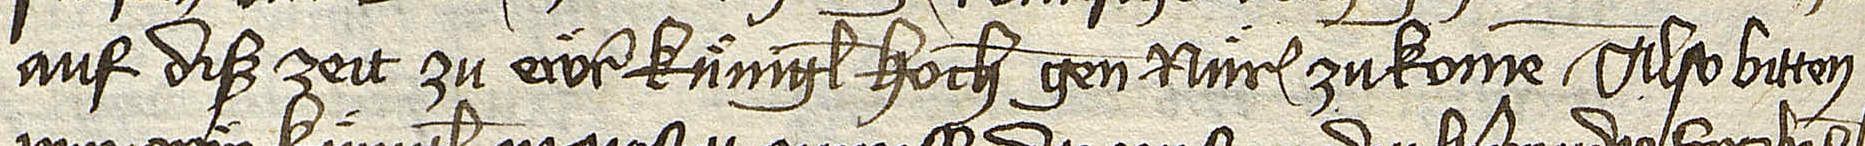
auf diſʒ cʒeit cʒu eẅr* künigl* hoch* gen Nür* ʒukome* / Alſo bitten
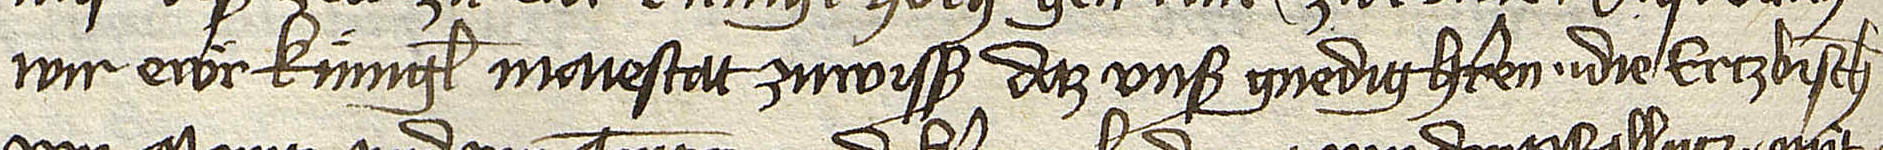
wir eẅr künigl* maieſtat ʒuwiſſ* daʒ vnſ* gnedig hr*en ~ die Ercʒbiſch*
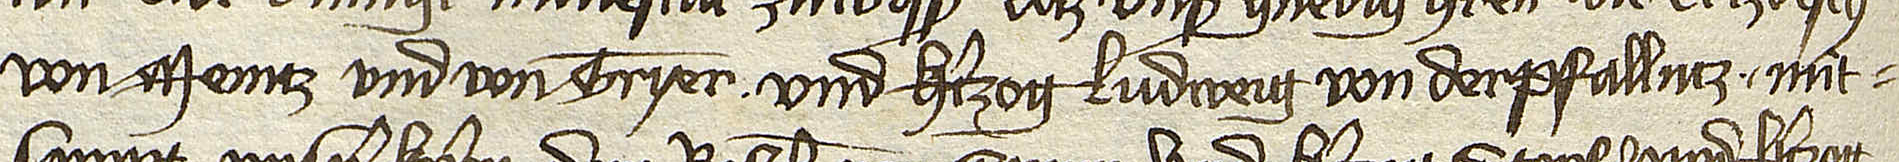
von Meincʒ vnd von Tryer vnd h*cʒog Ludweig von der Pfallncʒ . / mit =
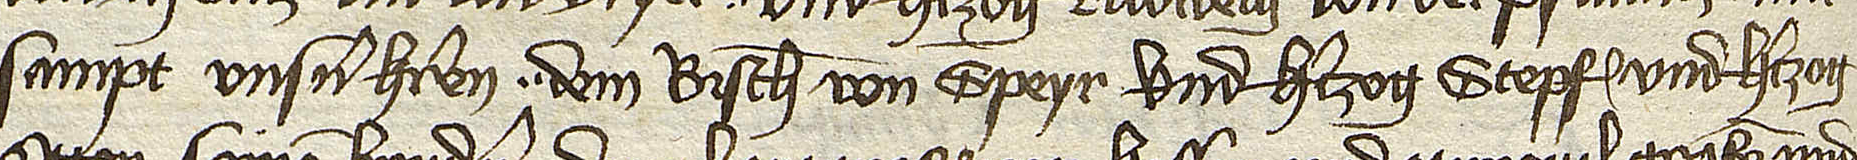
ſampt vnſn* hr*en ~ dem Biſch* von Speyr vnd h*cʒog Stepf* vnd h*cʒog
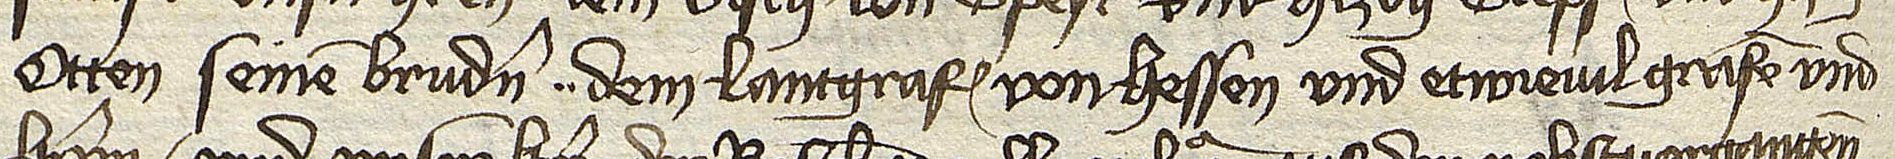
Otten ſeine* brudn* ~ dem lantgraf* von Heſſen vnd etwieuil grafe* vnd
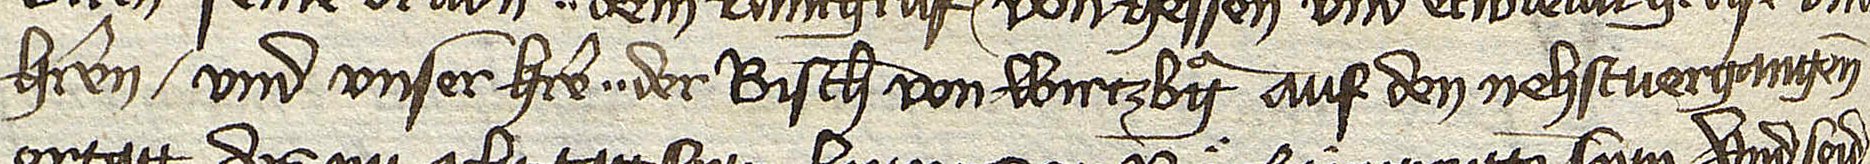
hr*en / vnd vnſer h*re ~ der Biſch* von wircʒb*g auf den nehſtuergangen*
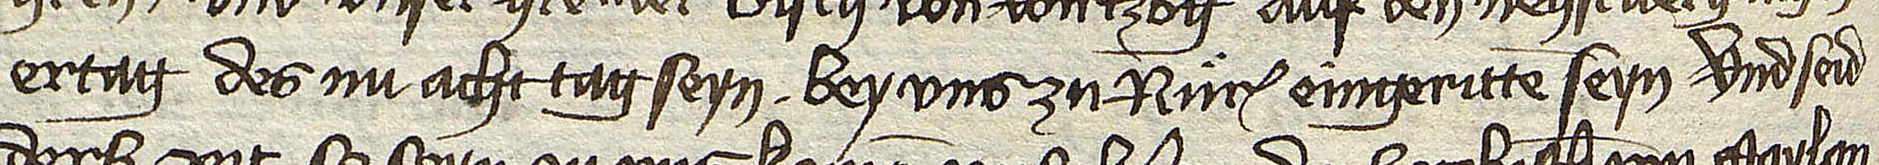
ertag des nu acht ſeyn . bey vns ʒu Nür* eingeritte* ſeyn Vnd ſeid
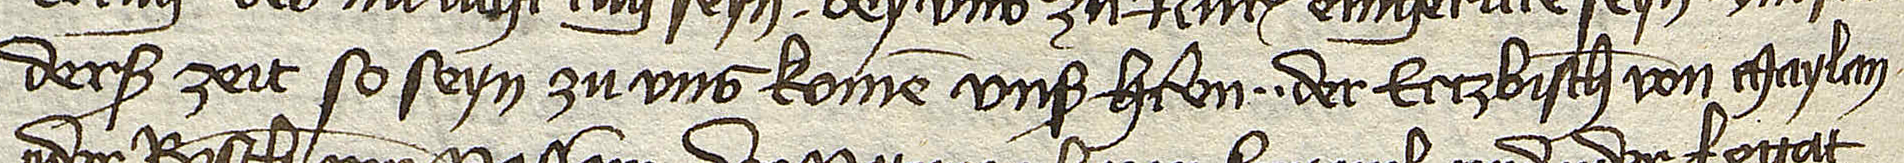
derſ* ʒeit ſo ſeyn ʒu vns kome* vnſ* hr*en ~ der Ercʒbiſch* von Maylan
